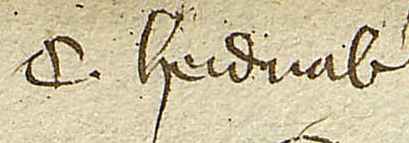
C . heidnab*
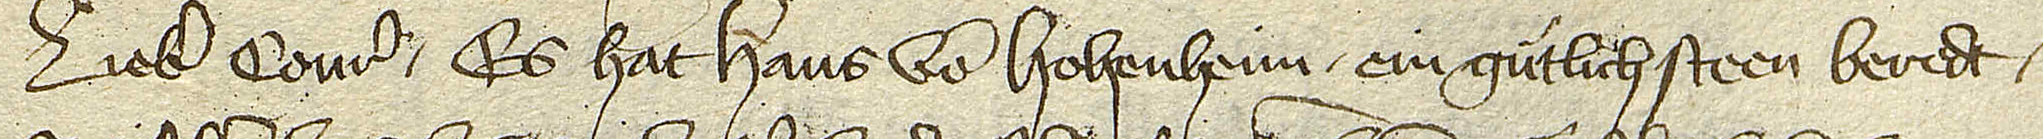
Lieb* Conr* / Es hat hans vo* hohenheim / ein gütlich ſteen beredt /
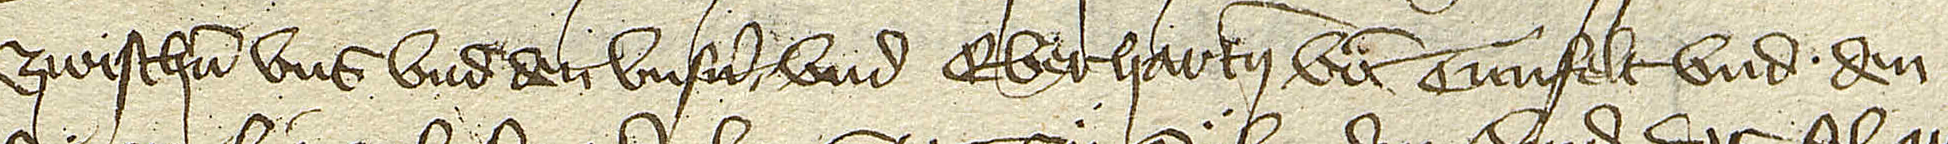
cʒwiſchn* vns vnd den vnſn* / vnd Eberhartn* vo* Tünfelt vnd den
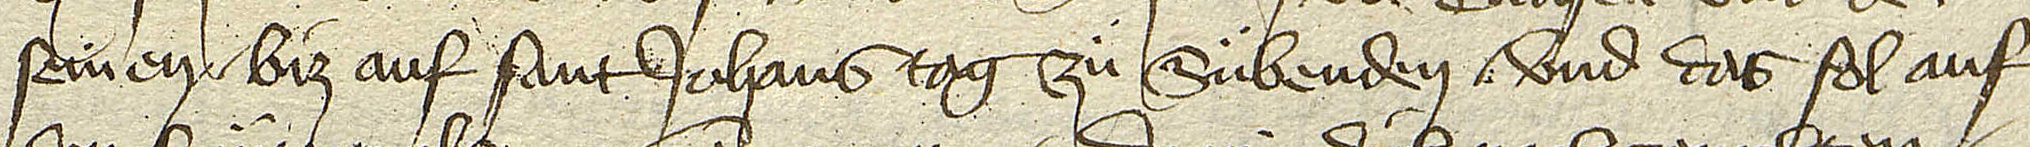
ſeinen / biʒ aus ſant Iohans tag cʒü Sübenden / vnd das ſol auf
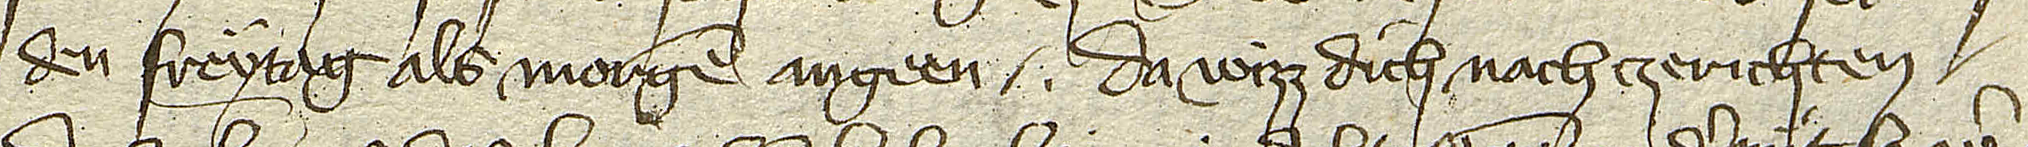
den freytag als morge* angeen / . da wiʒʒ dich nach cʒerichten /
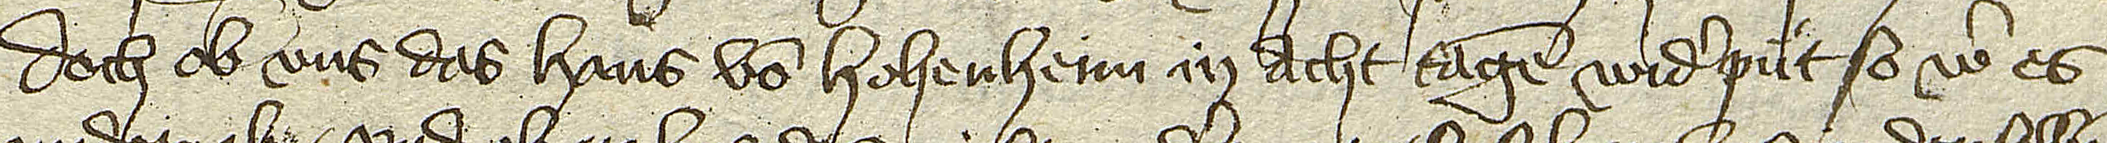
Doch ob vns das hans vo* hohenheim in Acht tage* wid*püt ſo w* es
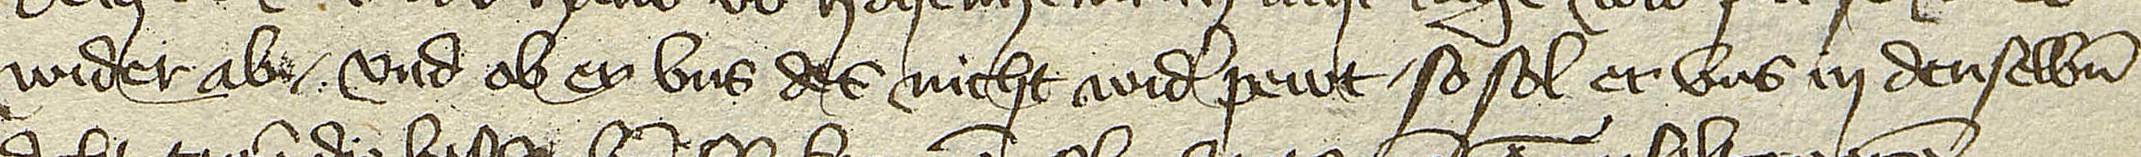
wider ab / vnd ob er vns des nicht wid*pewt / ſo ſol er vns in denſelbn*
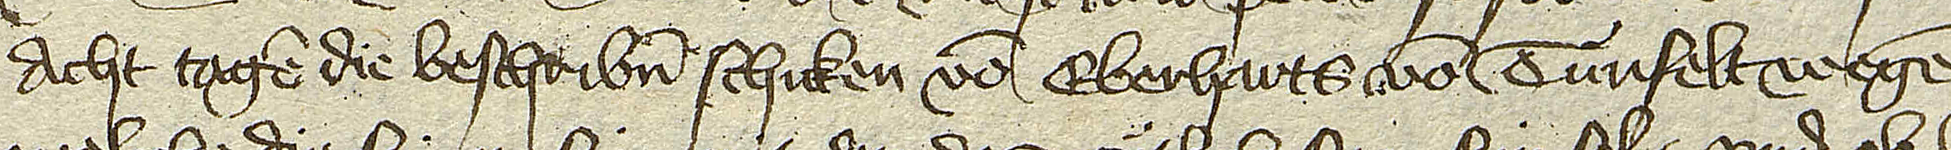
Acht tage* die beſchribn* ſchicken vo* Eberharts vo* Tünfelt wege*
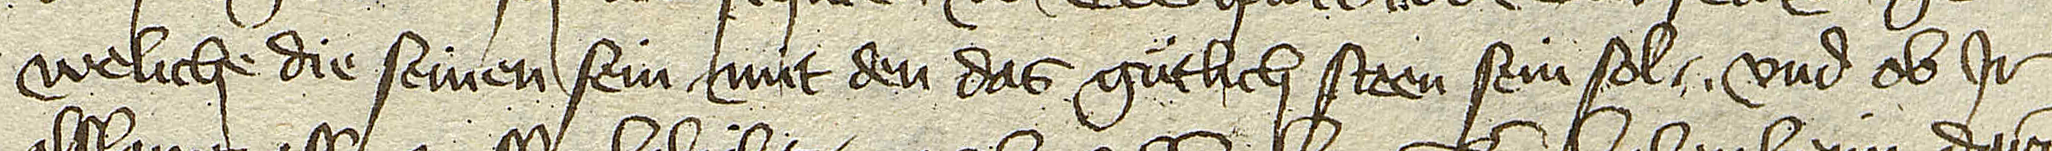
weliche die ſeinen ſeom / mit den das gütlich ſteen ſein ſol / . vnd ob Ir
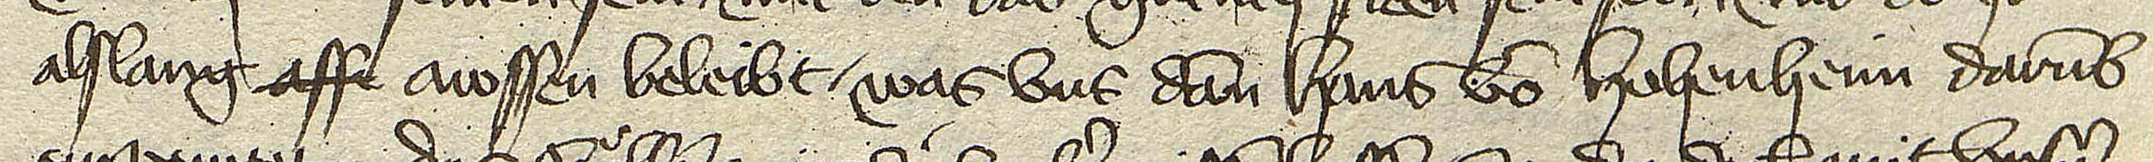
alſlang aſſe awſſen beleibt/ was vns dan* hans vo* hohenheim darub*
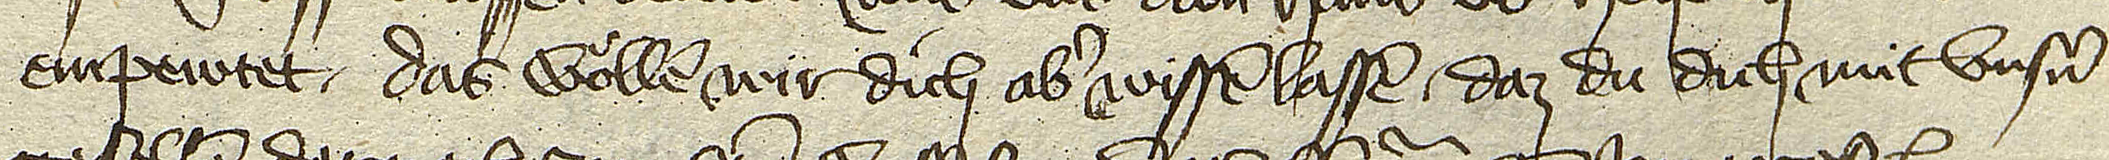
empewtet / das wölle wir dich ab* wiſſe* laſſe* / daʒ du dich mit vnſn*
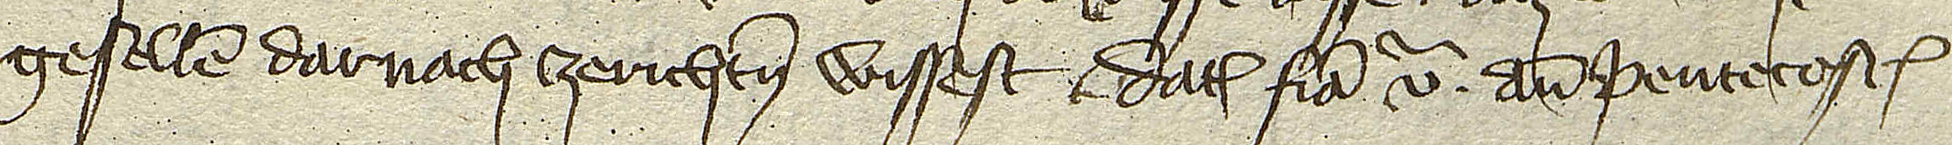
geſelle* darnach cʒerichtn* wiſſeſt / dat* fia* v* . an* Pentercoſt*
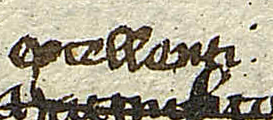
excellenti
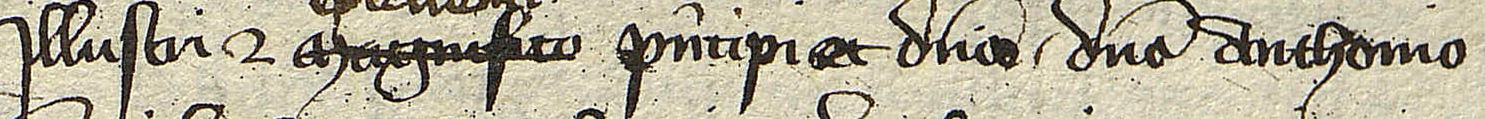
Illuſtri @ Magnifico p*ncipi et duce / d*no Anthonio
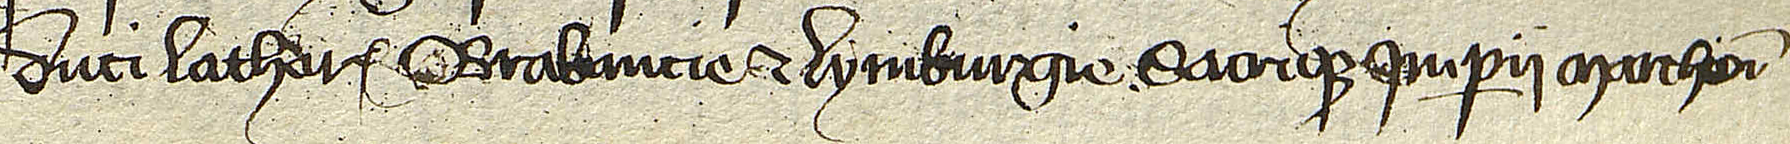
duci Lothar* Brabantie @ Lymburgie Sacriq* Imp*ii Marchion*
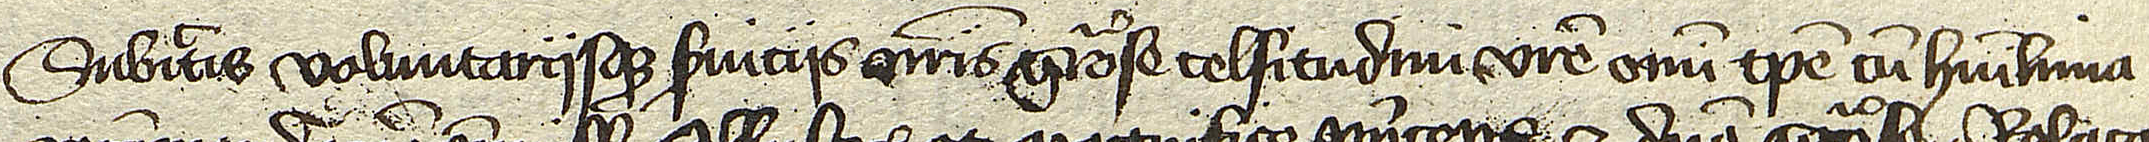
Subitis voluntariiſq* ſ*iciis n*ris g*r*oſe celſitudini v*r*e om*i t*p*e cu* hu*ili*ma
